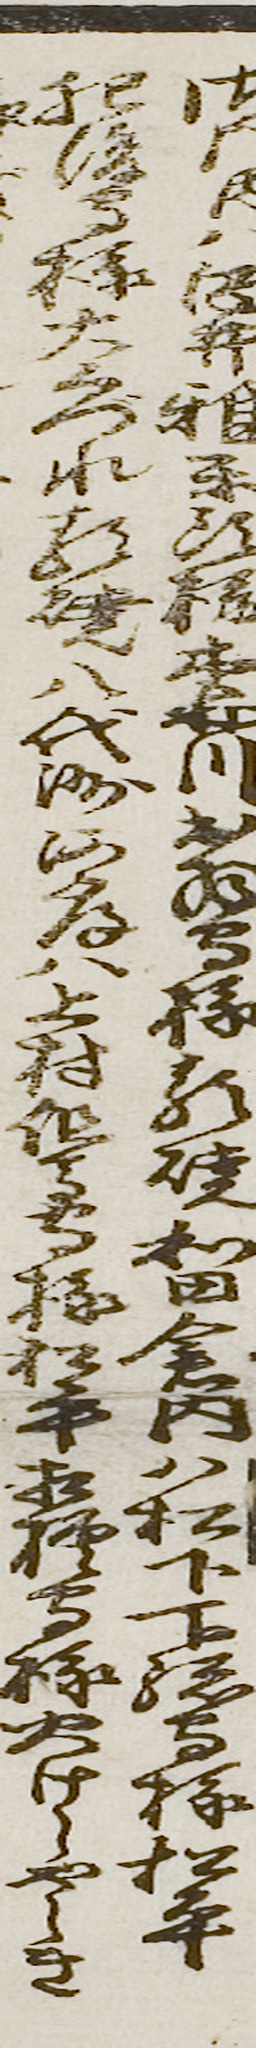肥後守様大くづれ類焼八代洲海岸ハ上村但馬守様松平相模守様火けしやしき
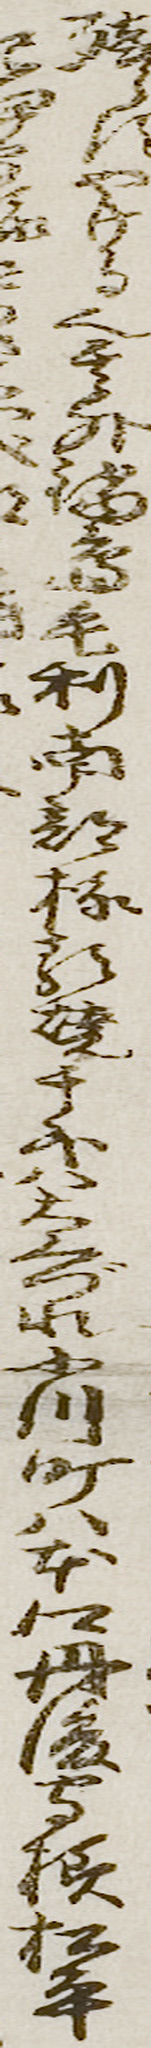残らずやける也其外嶋毛利南部様類焼其外ハ大くづれ小川町ハ本郷丹後守様松平
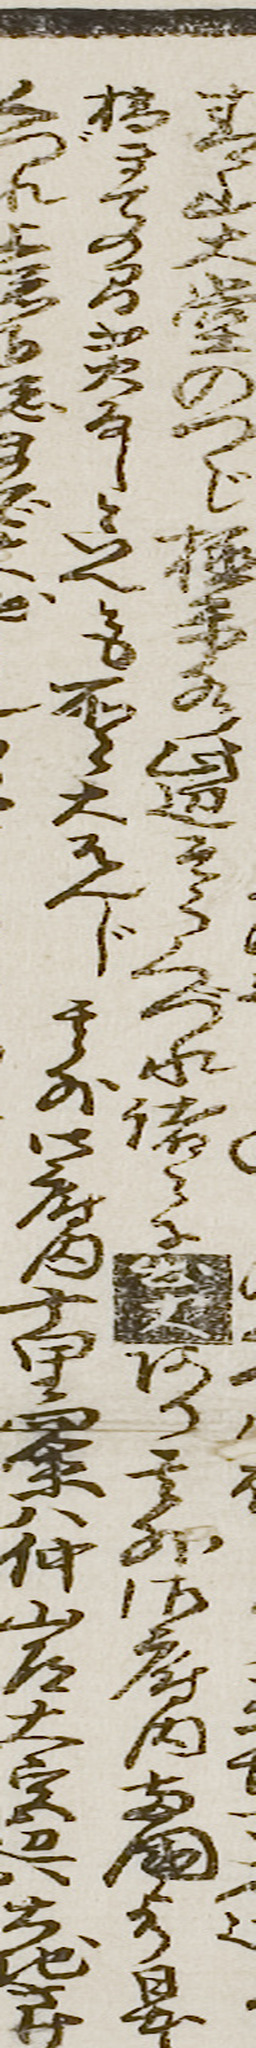橋までの間出火なしといへとも所々大そんじ其外御府内十里四余は仲山道大宮辺ハ大地さけ
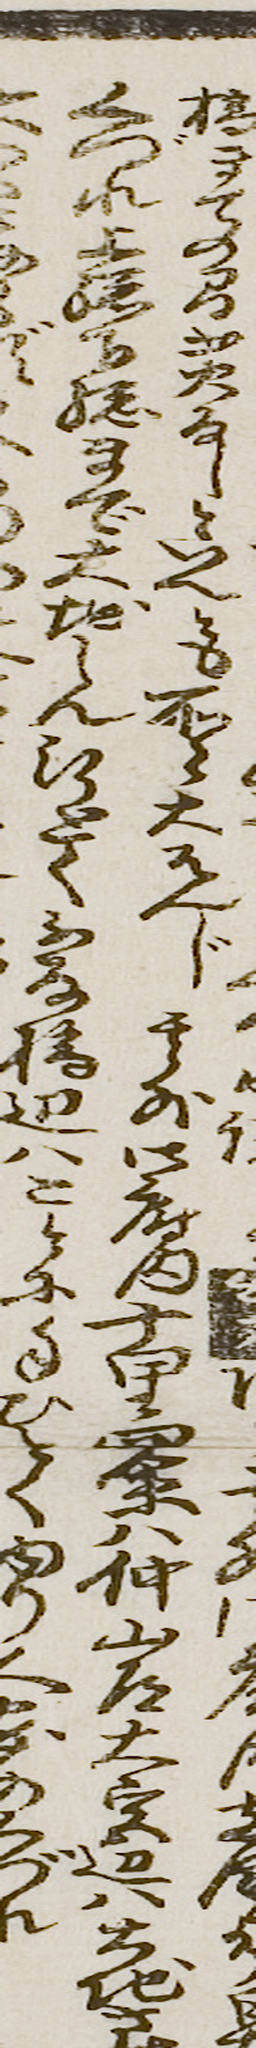くづれ上総下総大地震行とくふな橋辺ハことに手ひとくゆり人家のくづれ
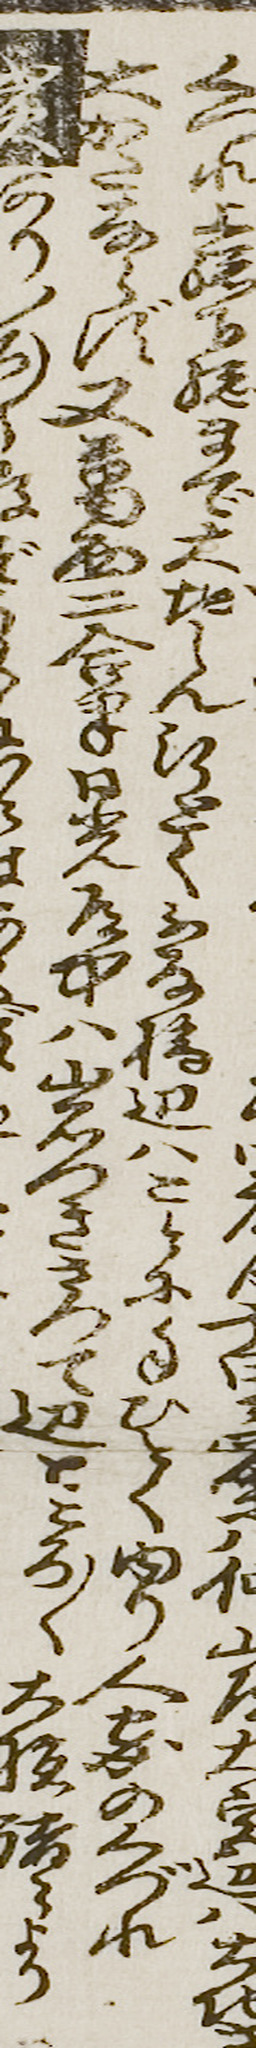大かたならず又葛西二合半日光道中ハ岩つきさつて辺ところ〳〵大抜諸々より
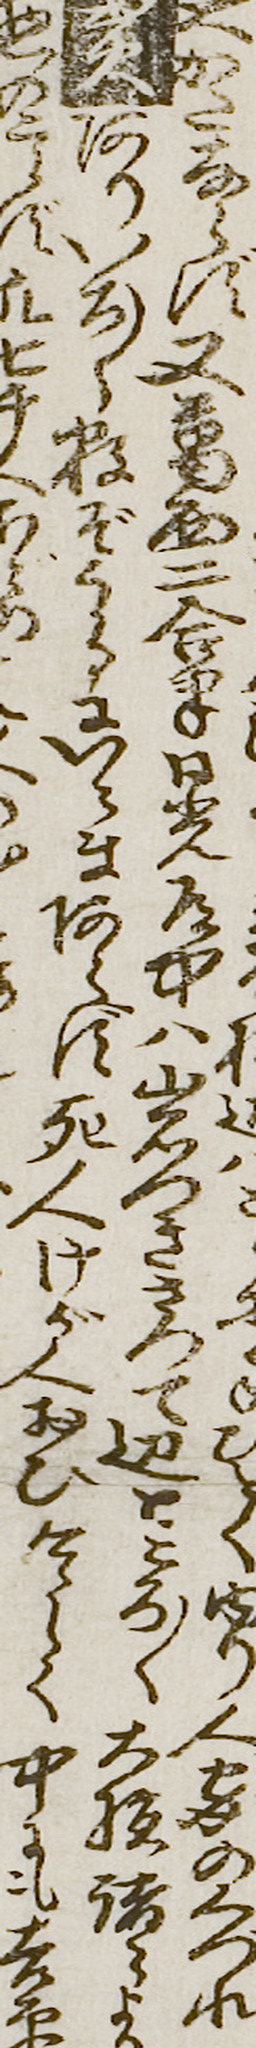出火ありいろ〳〵数ぞう事にいとまあらず死人けが人おひたゝしく中にも吉原ハ
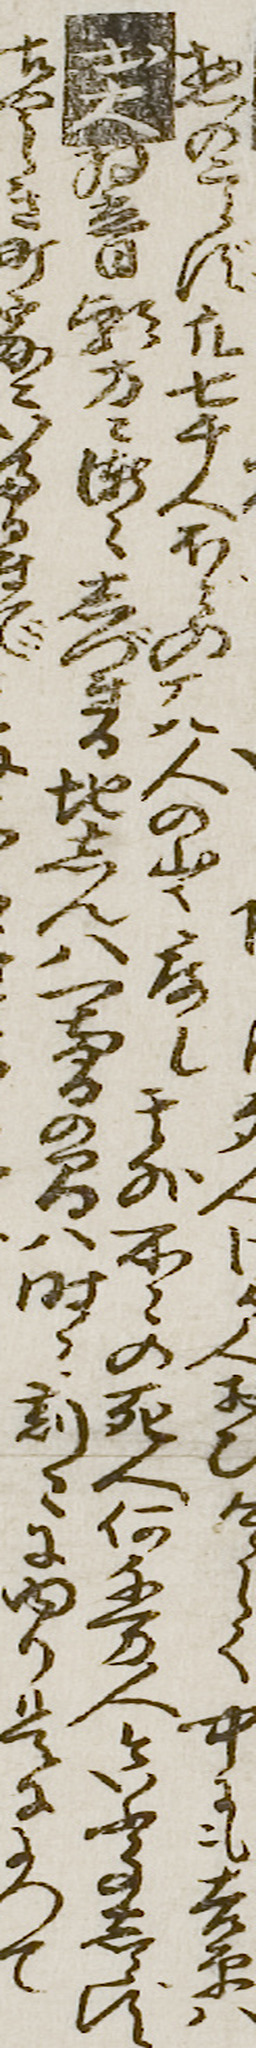出火翌朝方二漸々しづまる地しんハ一両日の間はハ時々刻々にゆり是によつて
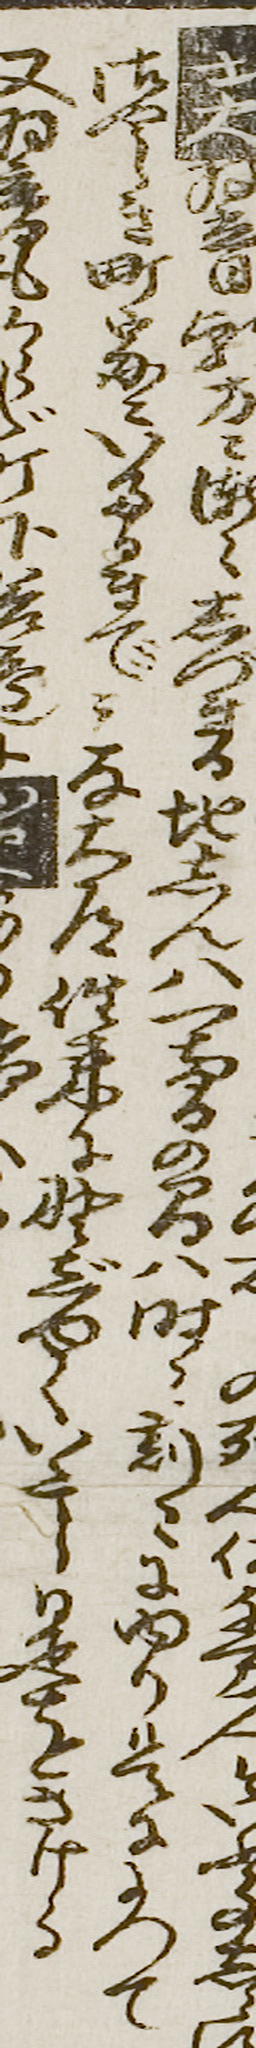御やしき町家二いたるまでミな大道往来に野じゆくいたしをさける
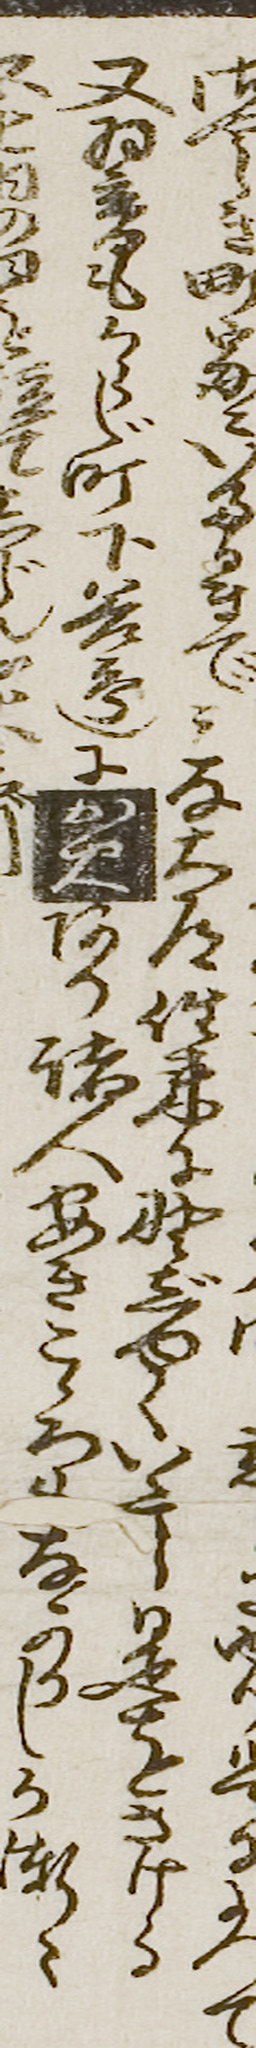又翌日もかうじ町下谷辺に出火あり諸人安きこゝろもなかりしか漸々
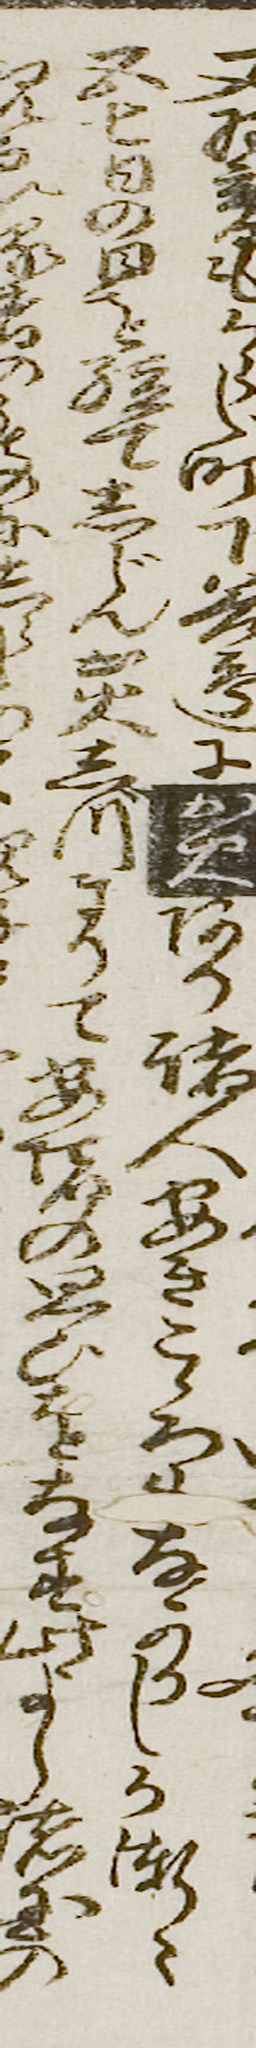五七日の日を経てしじん出火しつまりて安堵の思ひをなす此よし諸国の
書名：関東江戸大地震并大火方角場所附
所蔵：東京大学総合図書館 General Library in the University of Tokyo, JAPAN
